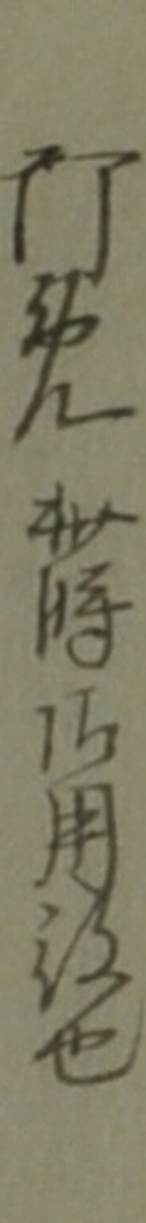御免此時御用役也
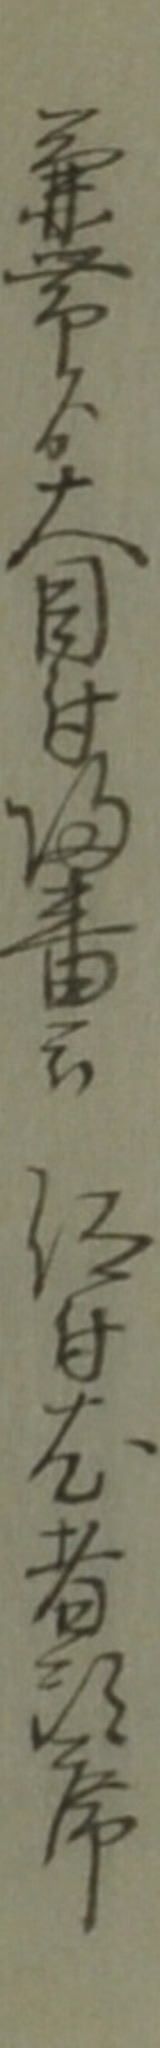兼帯ゟ大目付帰番被仰付尤者頭席
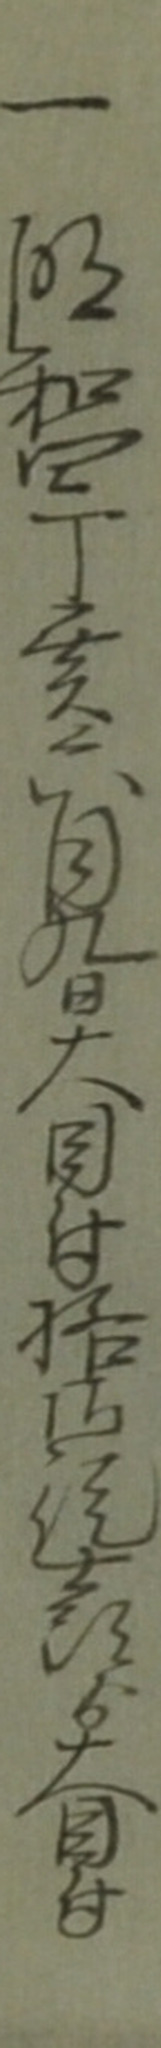一明和四丁亥六月九日大目付格御徒士頭ゟ大目付
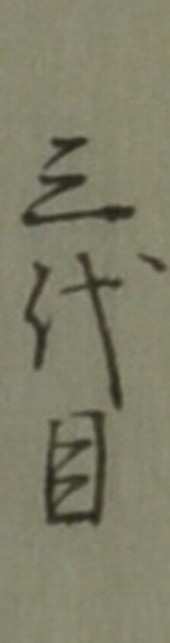三代目
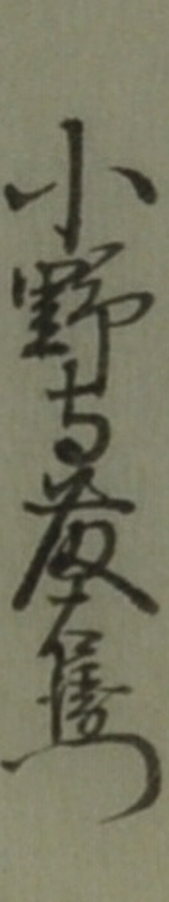小野寺藤右衛門
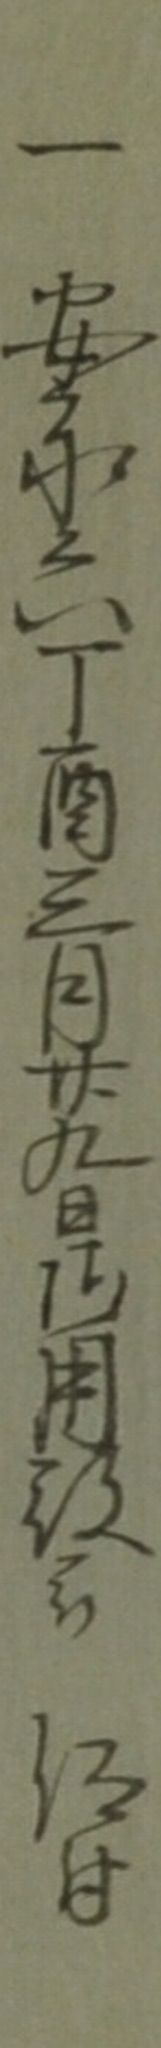一安永六丁酉三月廿九日御用役被仰付
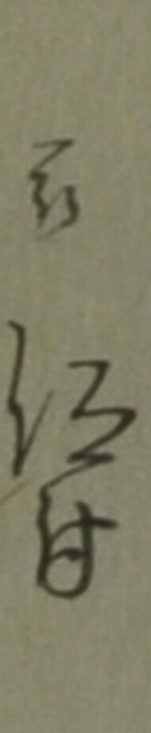被仰付
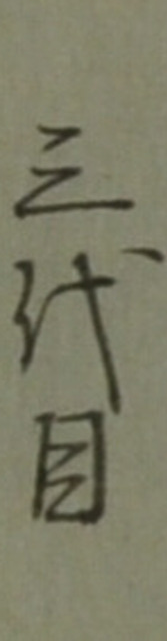三代目
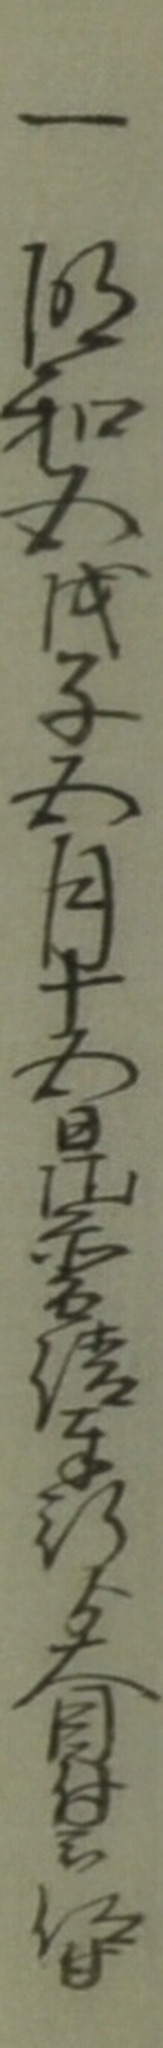一明和五戊子五月十五日御普請奉行ゟ大目付被仰付
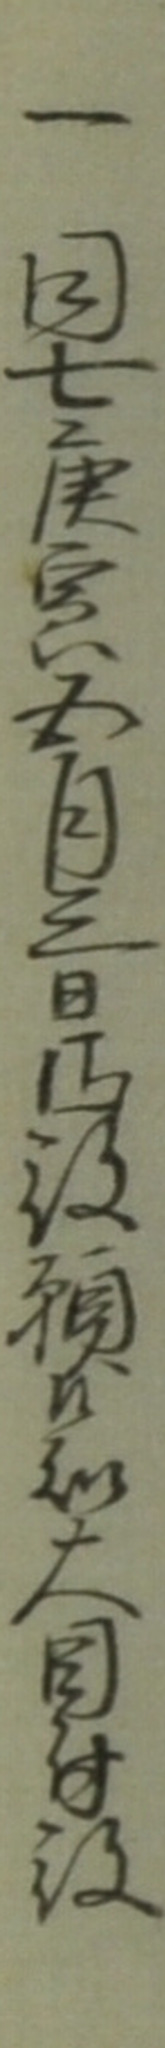一同七庚寅五月三日御役願候処大目付役
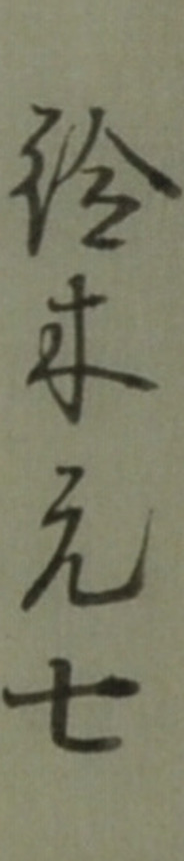鈴木元七

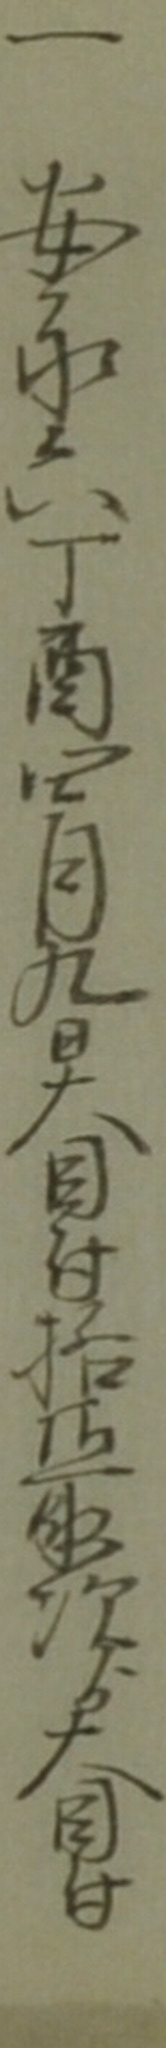一安永六丁酉四月九日大目付格御取次ゟ大目付
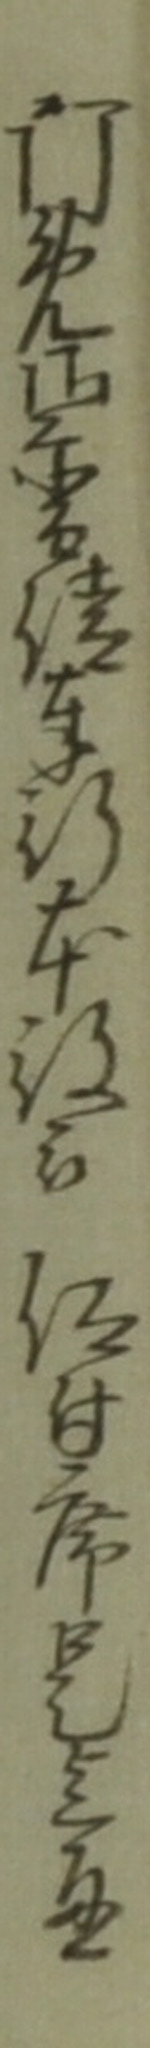御免御普請奉行本役被仰付席是迄通
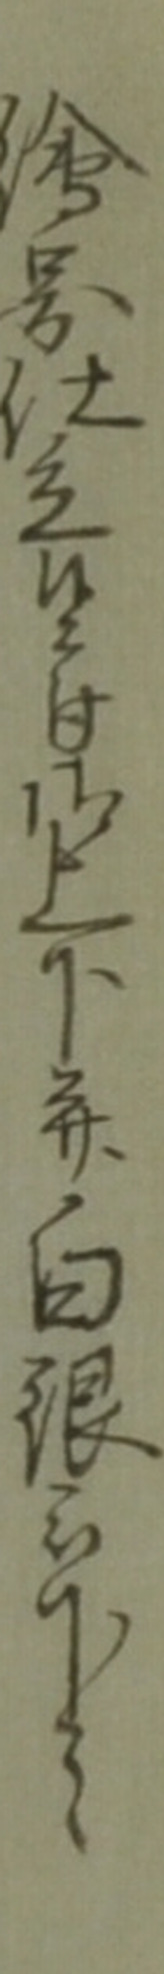絵図仕立候ニ付御上下并白銀被下之
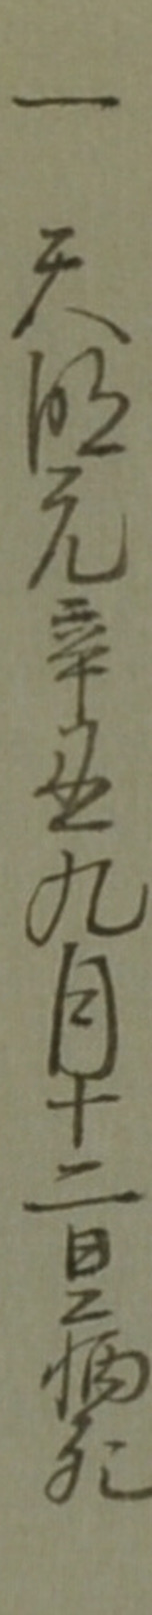一天明元辛丑九月十二日病死
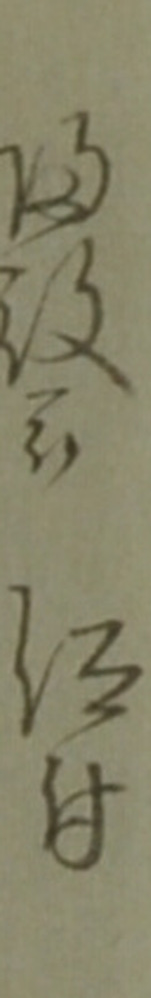帰役被仰付
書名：諸御役代々録（三）
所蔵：伊那市立高遠町図書館・合同会社AMANE
